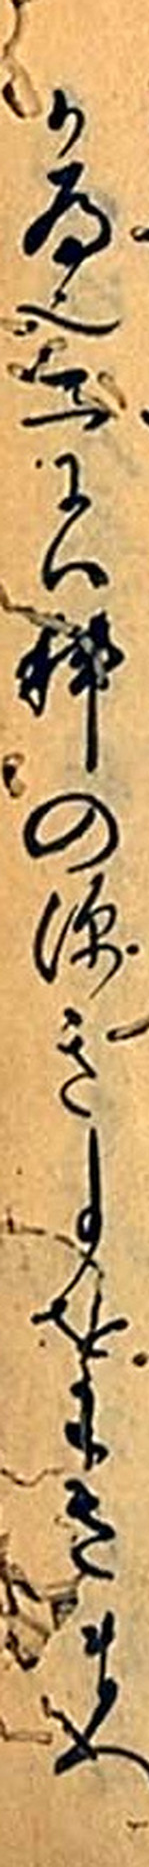か為也二には科の深き事をわきまへ

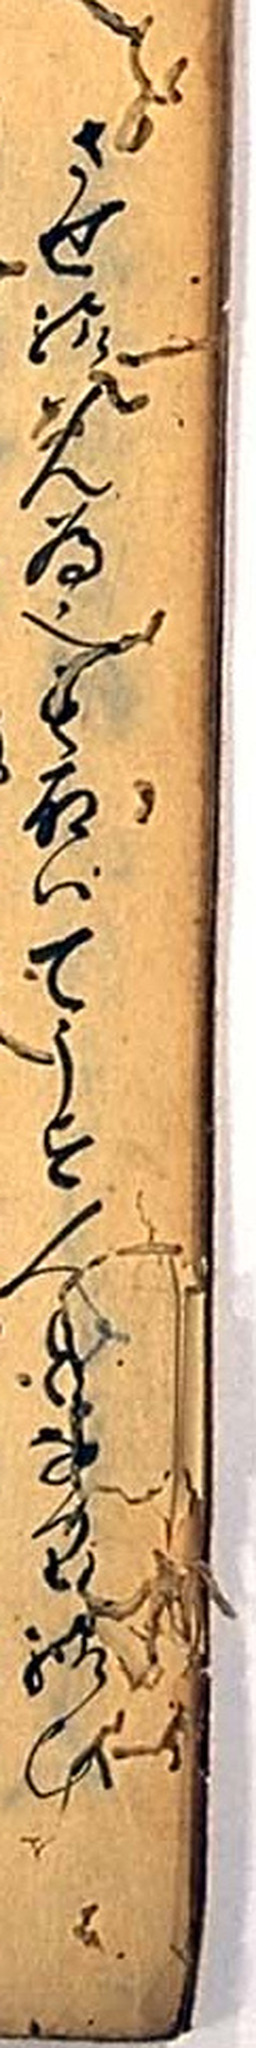させ給はん為也其故はてうす人となり給ひ
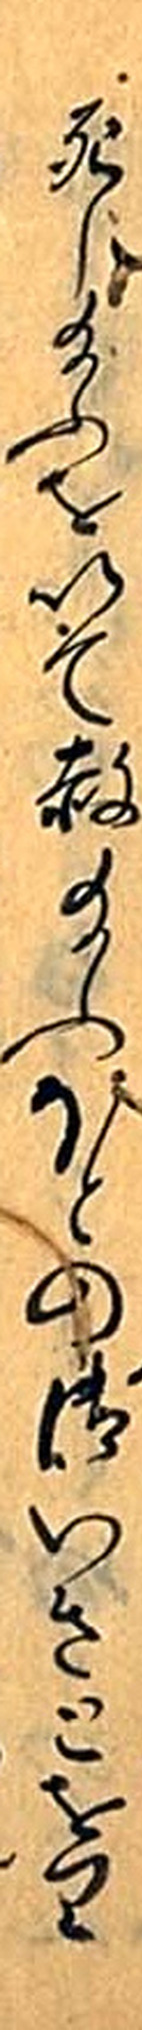死し給ふを以て赦給ふほとの御いきとをり
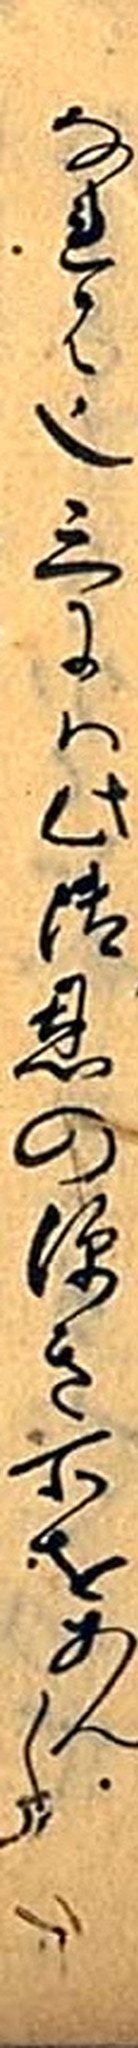なれは也三には此御恩の深き所をあんし
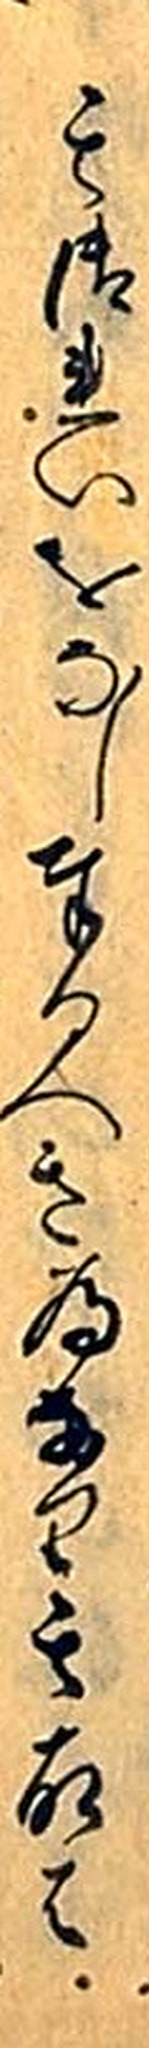其御れいをなし奉るへき為なり其故は
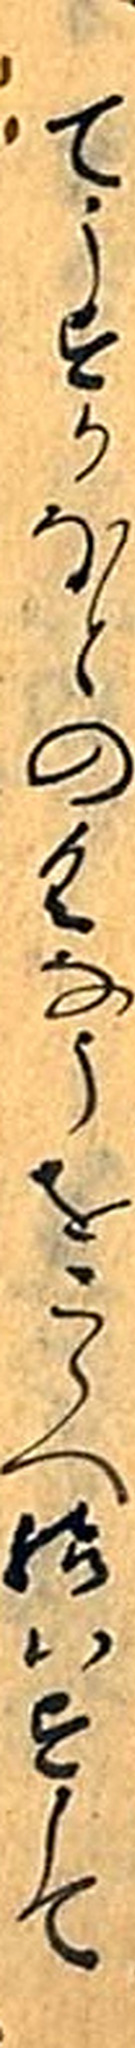てうすかほとのくなうをこらへ給はすして
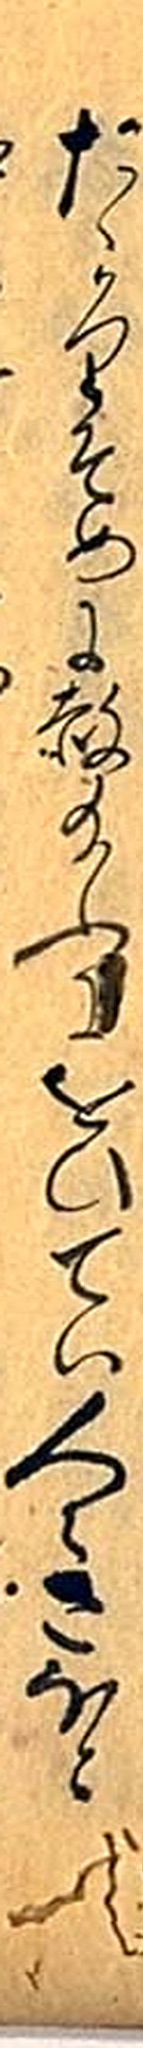たゝかりそめに赦給ふにをいては人々さほと
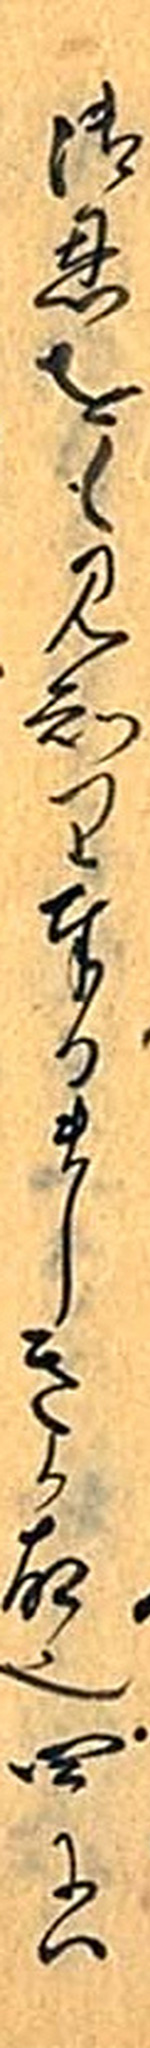御恩をも見知り奉るましきか故也四には
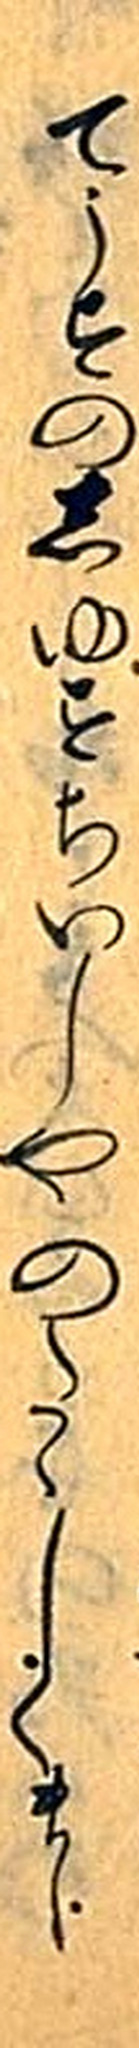てうすのしゆすちいしやのたゝしくまし
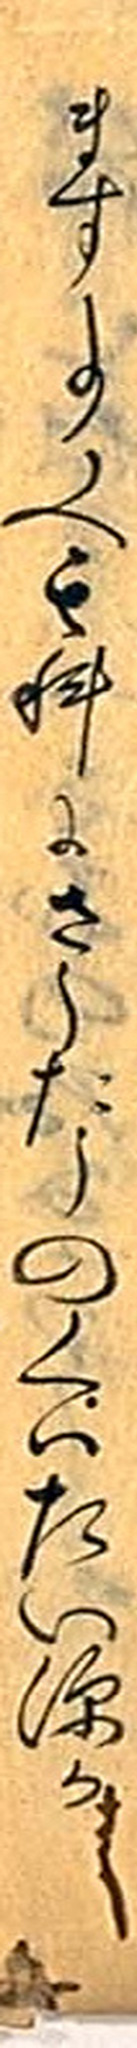ます事又其科にさうたうのくはたい深か
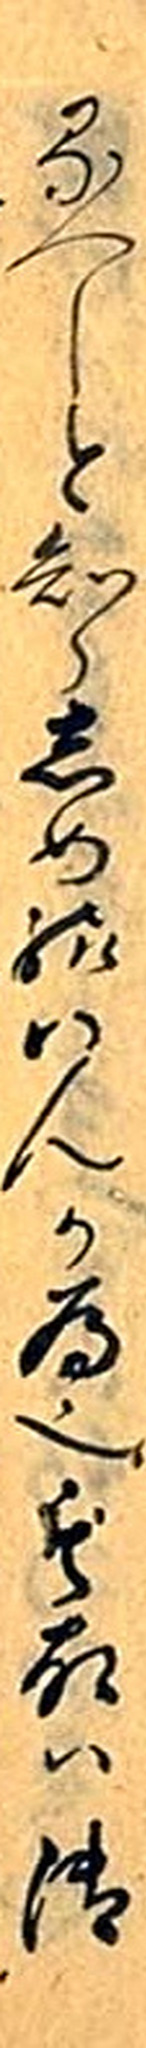るへしと知らしめ給はんか為也其故は御
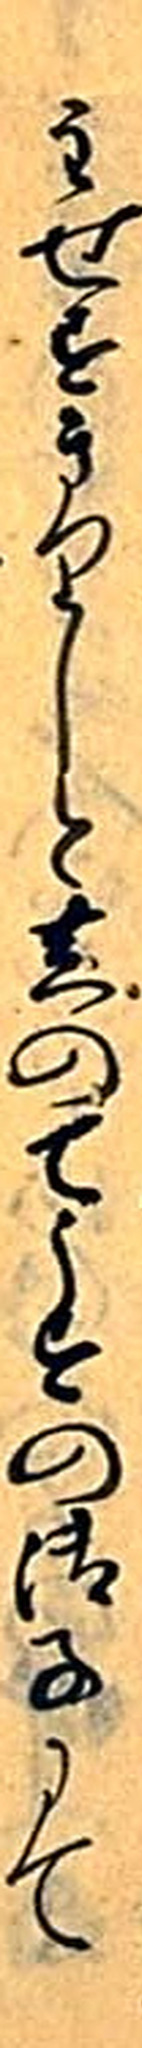主せすきりしと真のてうすの御子にて
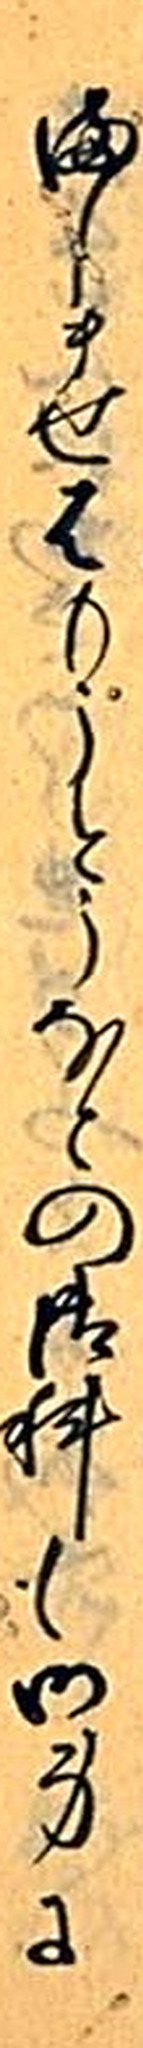ましませはもうとうほとの御科も御身に
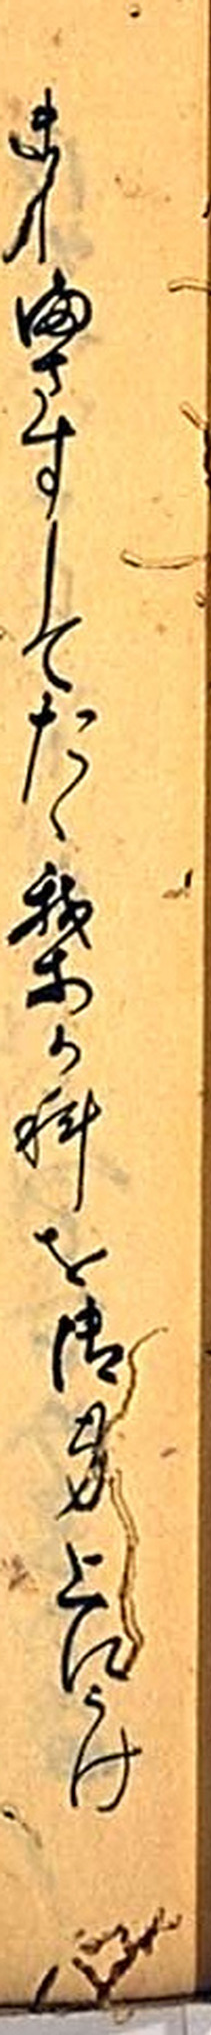ましまさすしてたゝ我等か科を御身上にうけ
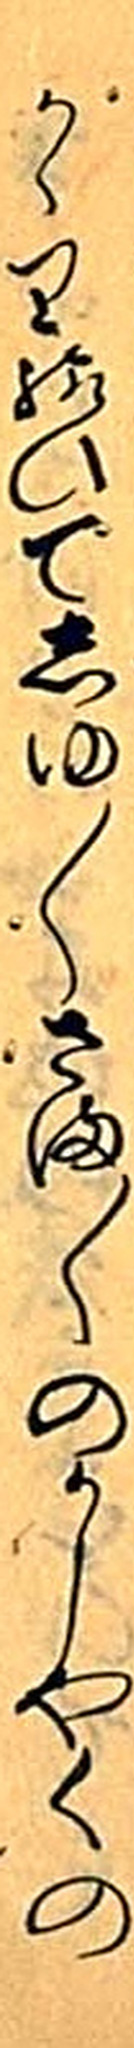かゝり給ひてしゆ〳〵さま〳〵のかしやくの
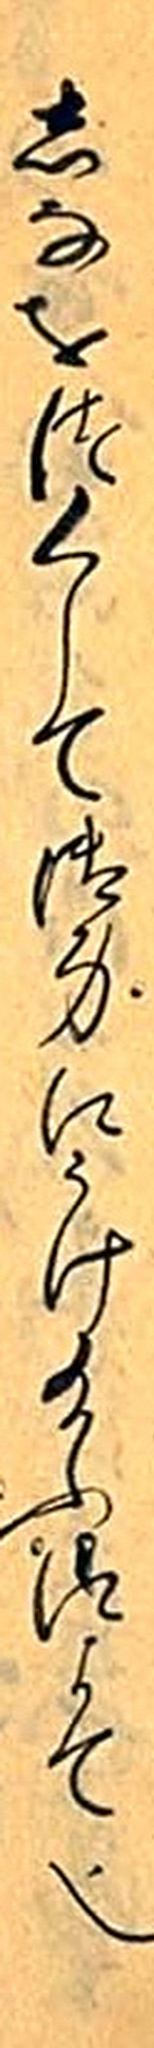しなをつくして御身にうけ給ふによて也
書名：ドチリナ・キリシタン
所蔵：東京大学総合図書館 / General Library in the University of Tokyo
